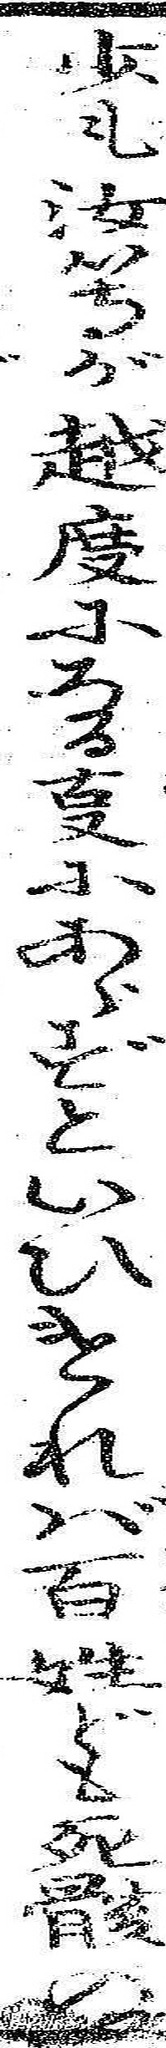少も汝等が越度になる事にあらずといひければ。百姓ども死骸の
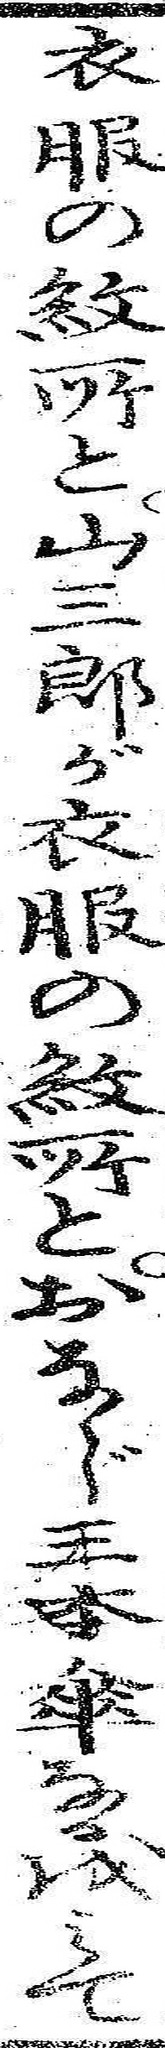衣服の紋所と。山三郎が衣服の紋所と。おなじ三本傘なるをみて。
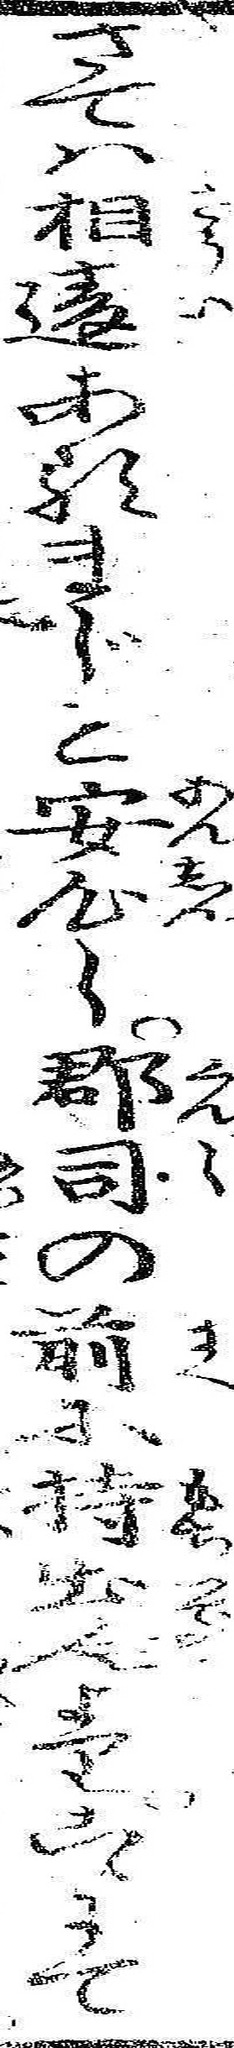さては相違あるまじと安心し。郡司の前に持出んより。こゝにて
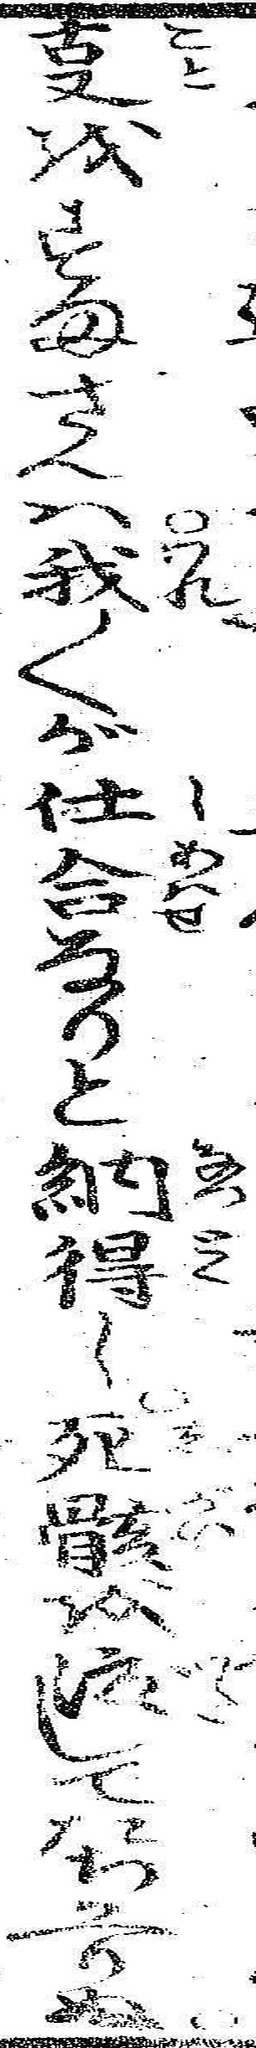事をすまさんは。我々が仕合なりと納得し。死骸を渡してたちかへりぬ。
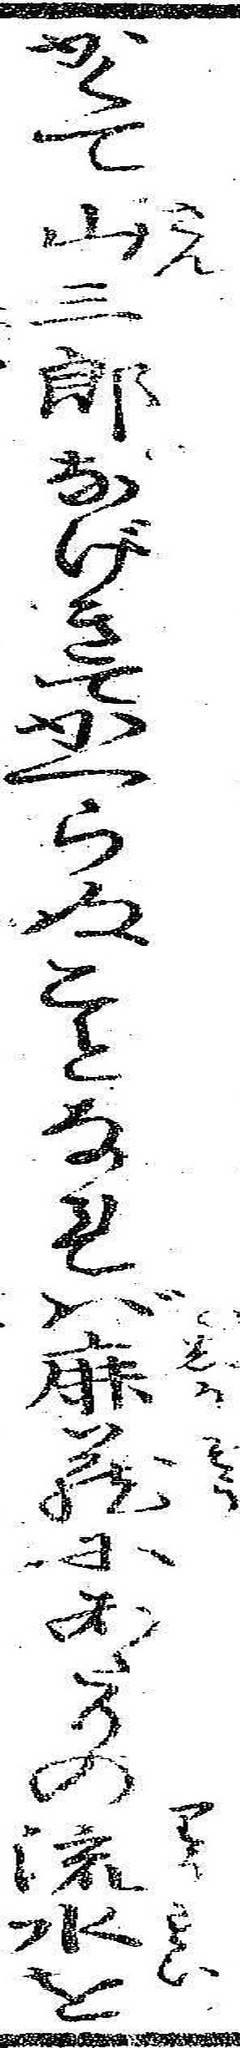かくて山三郎。なげきてかへらぬことなれば。鹿蔵にあたりの流水を
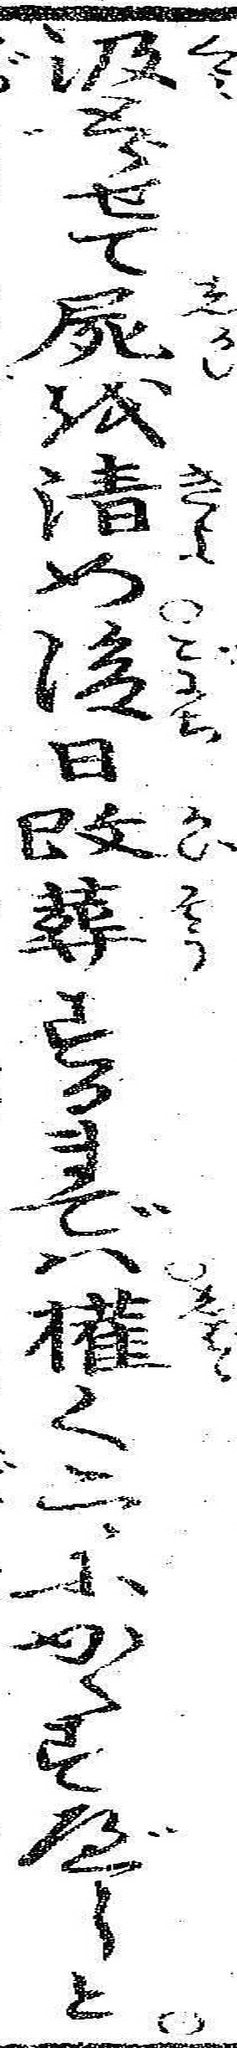汲とらせて屍を清め。後日改葬するまでは。権くこゝにかくすべしと。
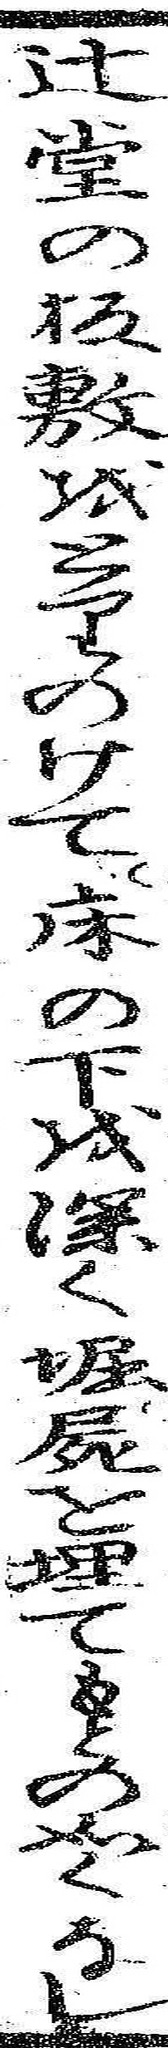辻堂の板敷をとりのけて。床の下を深く堀。屍を埋てもとの如くなし
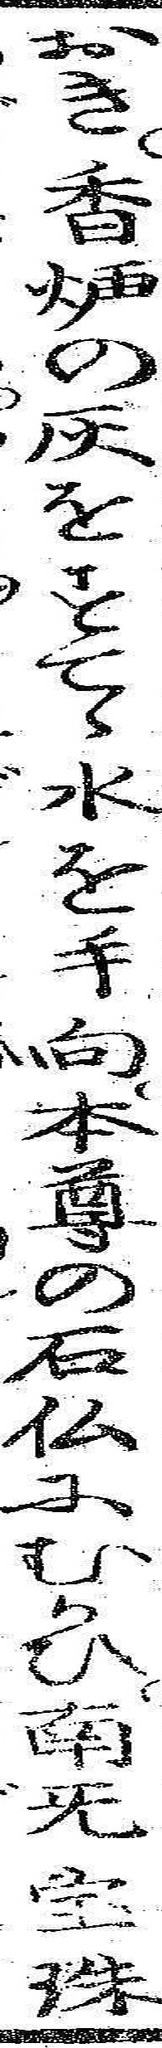おき。香炉の灰をすてゝ水を手向。本尊の石仏にむかひ。南無宝珠
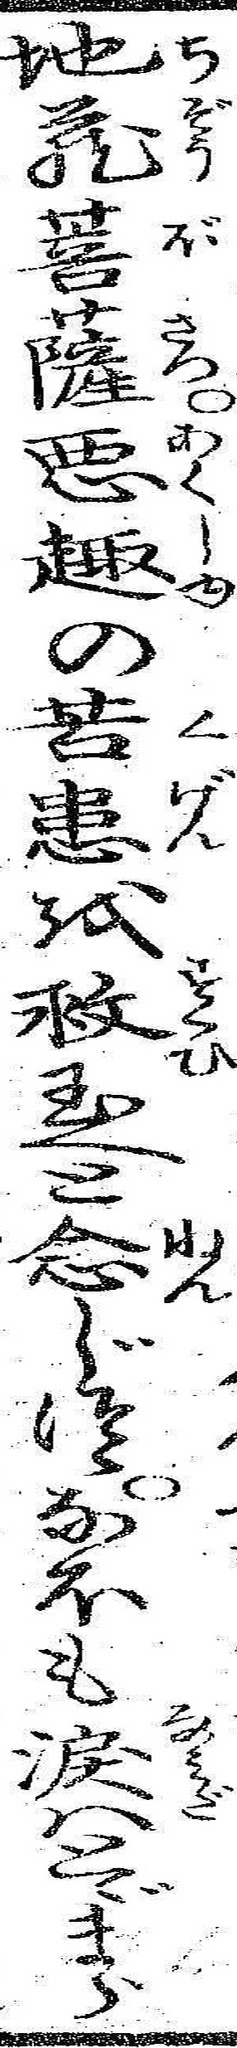地蔵菩薩。悪趣の苦患を救玉へと念じつゝ。なほも涙はとゞまら
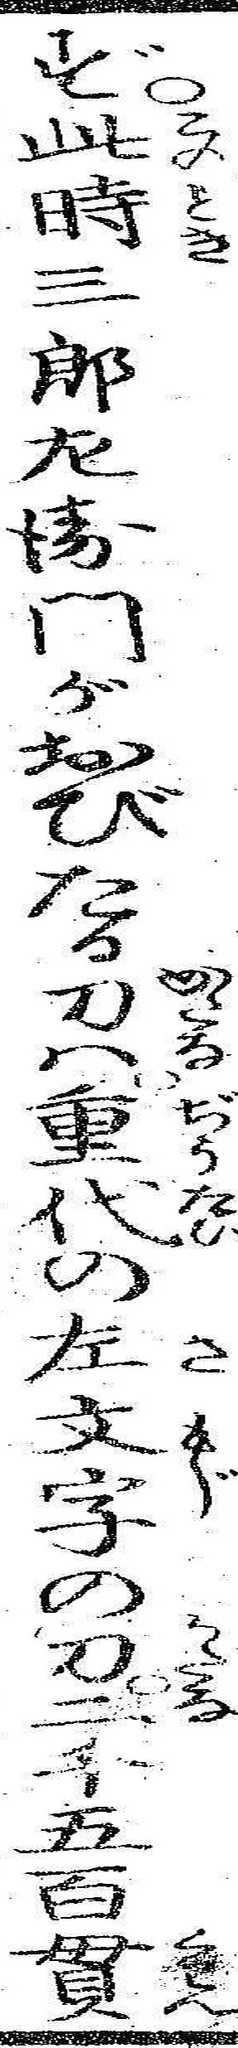ず。此時三郎左衛門がおびたる刀は。重代の左文字の刀。二千五百貫
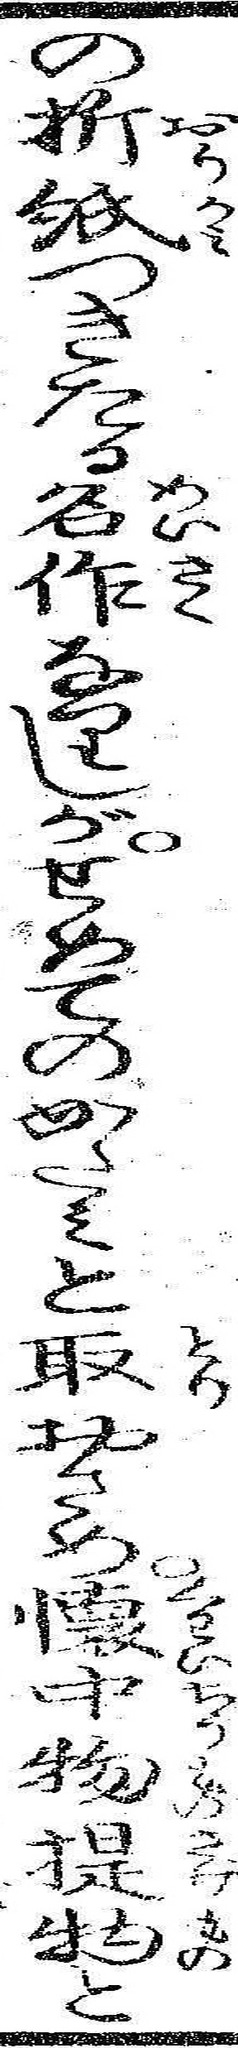の折紙つきたる名作なりしが。せめてのかたみと取おさめ。懐中物提物と
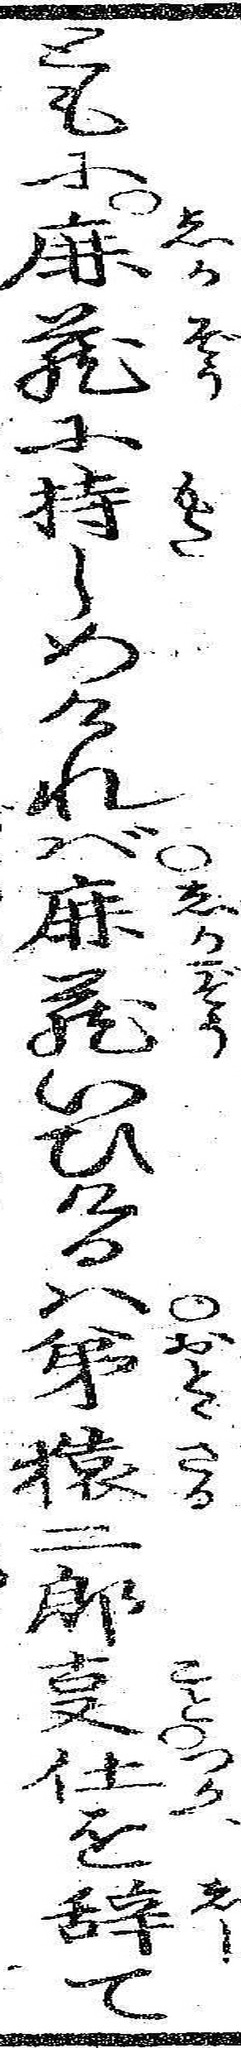ともに。鹿蔵に持しめければ。鹿蔵いひけるは。弟猿二郎事。仕を辞て
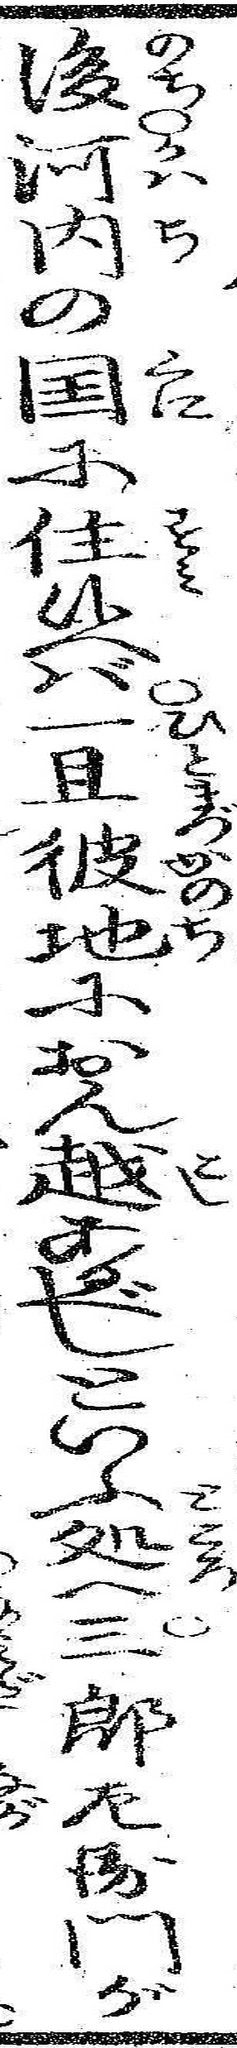後。河内の国に住候へば。一且彼地におん越あるべしといふ処へ。三郎左衛門が
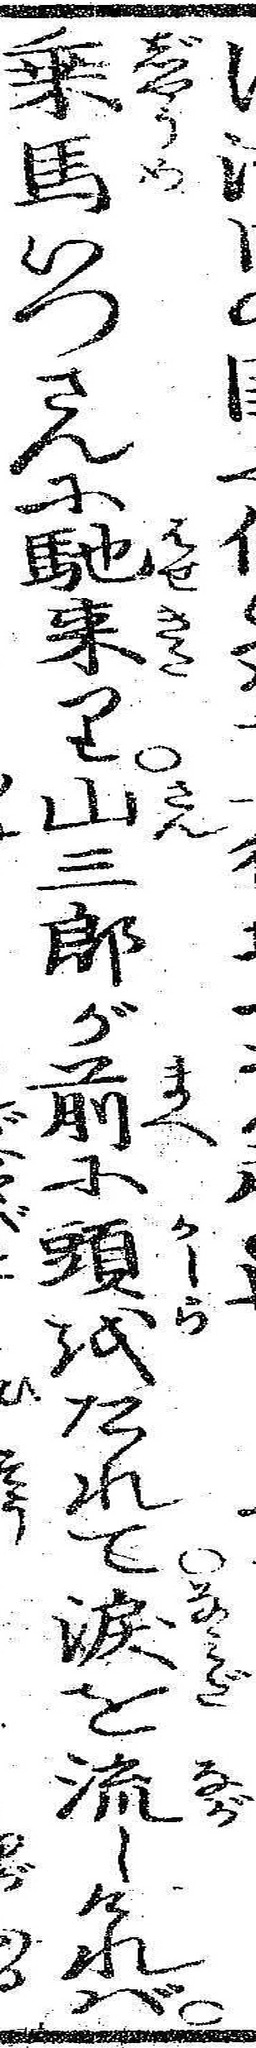乗馬いつさんに馳来り。山三郎が前に頭をたれて。涙を流しければ。
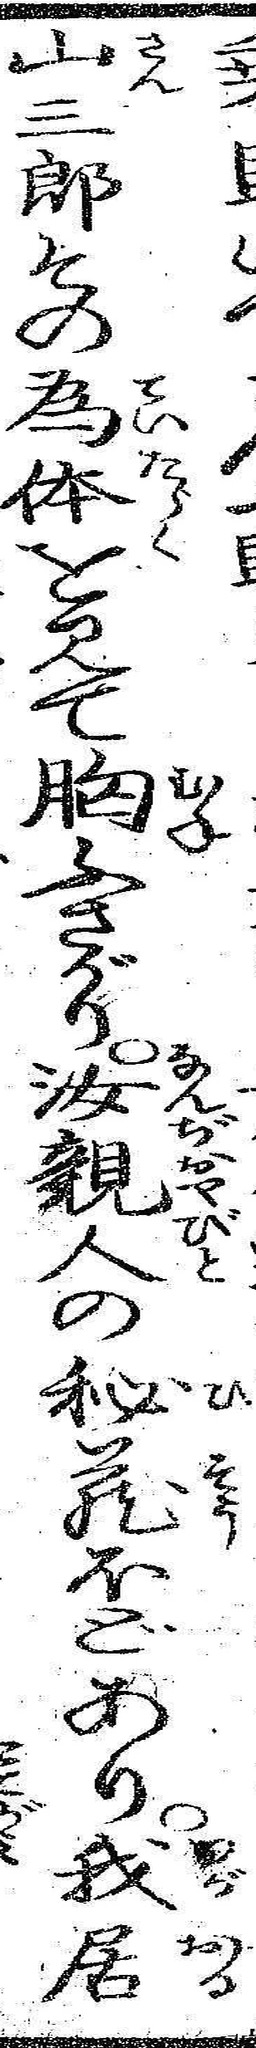山三郎その為体を見て胸ふさがり。汝親人の秘蔵ほどあり。我居
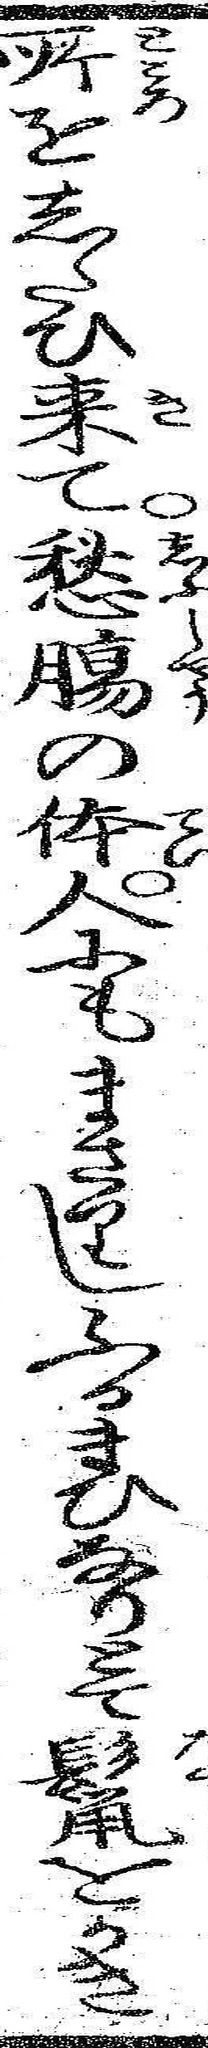所をしたひ来て。愁膓の体。人にもまさりしふるまひなりとて鬣をかき
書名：昔話稲妻表紙
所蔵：国文学研究資料館
